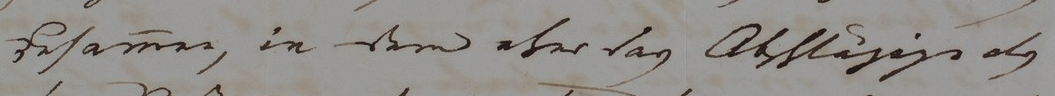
zusammen, in dem eher das Abschlägige als
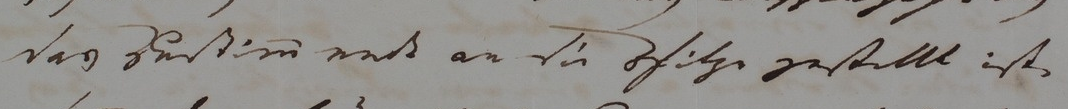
das Zustimmende an die Spitze gestellt ist,
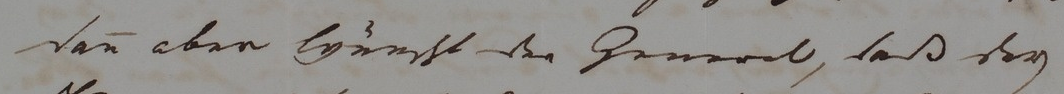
dann aber wünscht der General, daß der
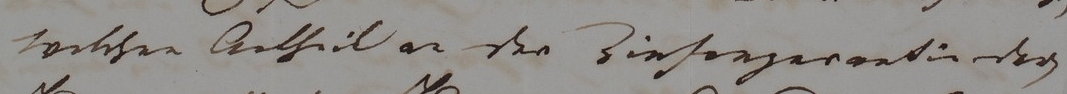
welchen Antheil an der Zinsengarantie der
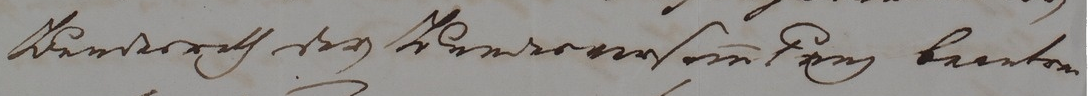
Bundesrath der Bundesversammlung beantra-
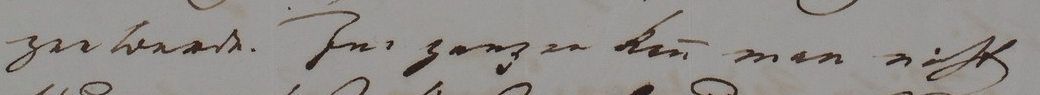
gen werde. Im ganzen kann man nicht
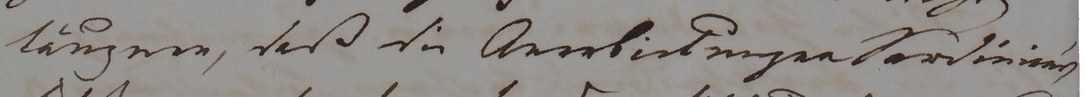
läugnen, daß die Anerbietungen Sardiniens
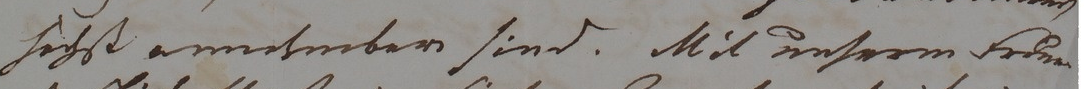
höchst annehmbar sind. Mit unserm Freun-
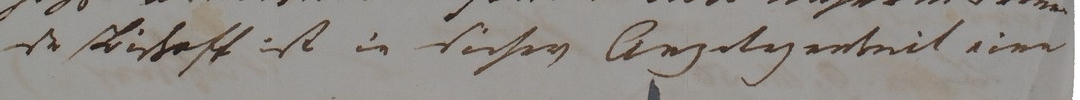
de Bischoff ist in dieser Angelegenheit eine
